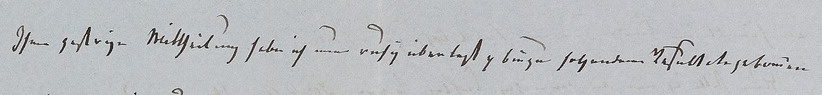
Ihre gestrige Mittheilung habe ich nun ruhig überlegt & bin zu folgendem Resultate gekommen
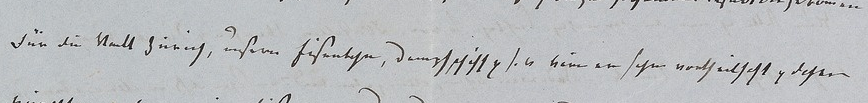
Für die Stadt Zürich, unsere Eisenbahn, Dampfschiff &s. w wäre es sehr vortheilhaft & daher
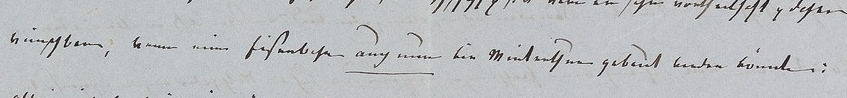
wünschbar, wenn eine Eisenbahn auch nur bis Winterthur gebaut werden könnte:
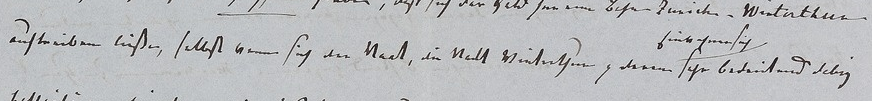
auftreiben ließe, selbst wenn sich der Staat, die Stadt Winterthur & deren Einwohner sich sehr bedeutend dabey
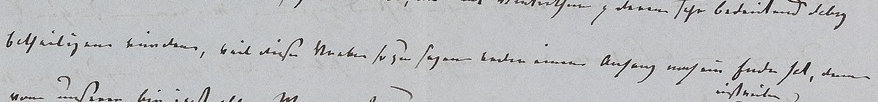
betheiligen würden, weil diese Streke so zu sagen weder einen Anfang noch ein Ende hat, denn
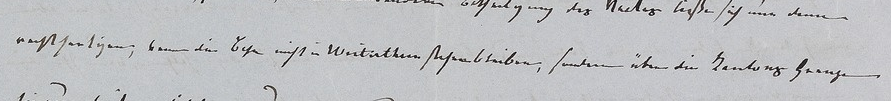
rechtfertigen wenn die Bahn nicht in Winterthur stehenbleiben, sondern über die Kantons Grenze
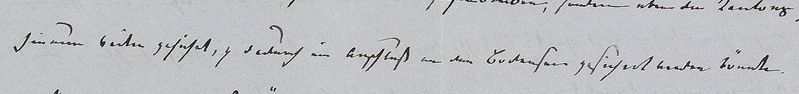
hinaus weiter geführt, & dadurch im Anschluß an den Bodensee gesichert werden könnte.
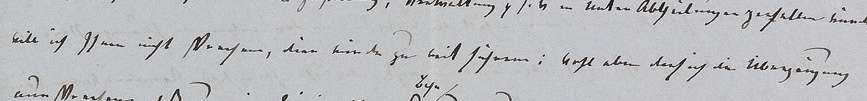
will ich Ihnen nicht sprechen, dies würde zu weit führen: wohl aber darf ich die Überzeugung
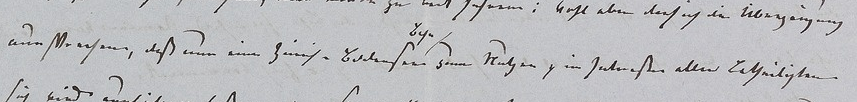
aussprechen, daß nur eine Zürich–BodenseeBahn zum Nutzen & im Intereße aller Betheiligten
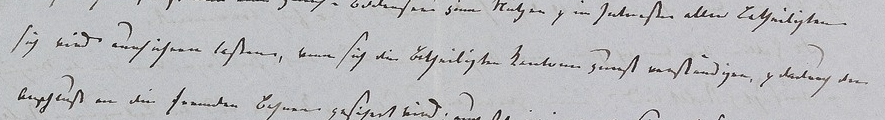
sich wird ausführen laßen, wenn sich die Betheiligten Kantone zuerst verständigen, & dadurch der
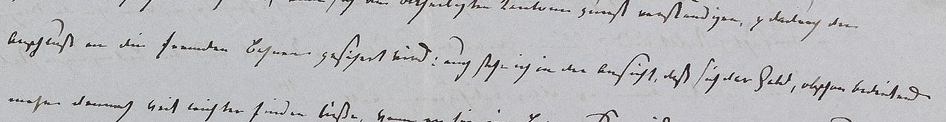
Anschluß an die fremden Bahnen gesichert wird: auch stehe ich in der Ansicht, daß sich das Geld, obschon bedeutend
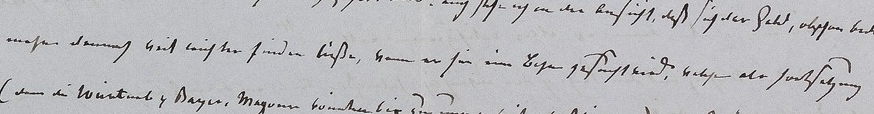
mehr dennoch weit leichter finden ließe, wenn es für eine Bahn gesucht wird, welche als Fortsetzung
